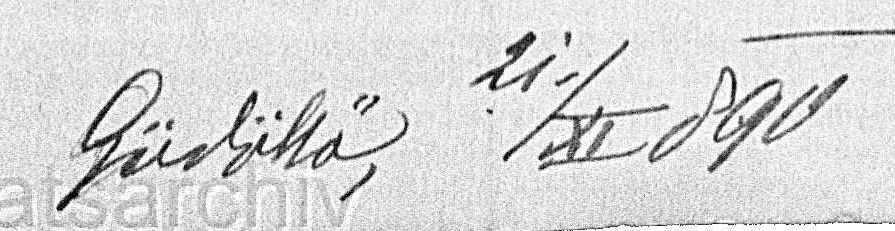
Gödökö, 21./XI 890
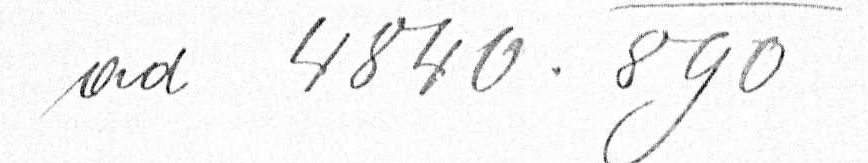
ad 4840. 890
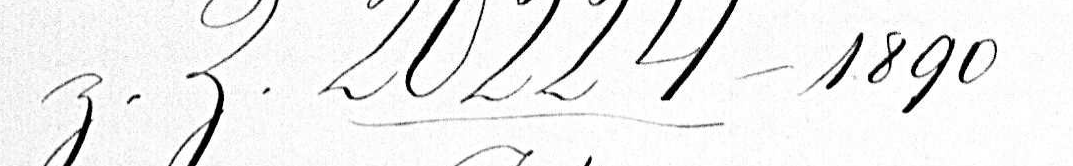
z. Z. 20224-1890
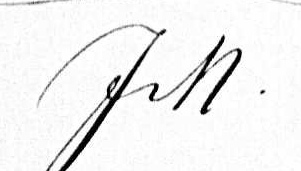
J. M.
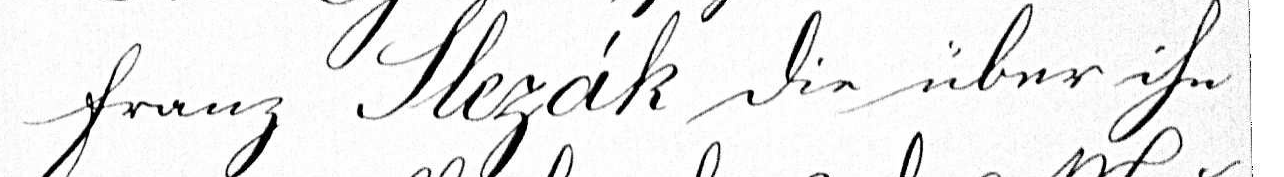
Franz Slezák die über ihn
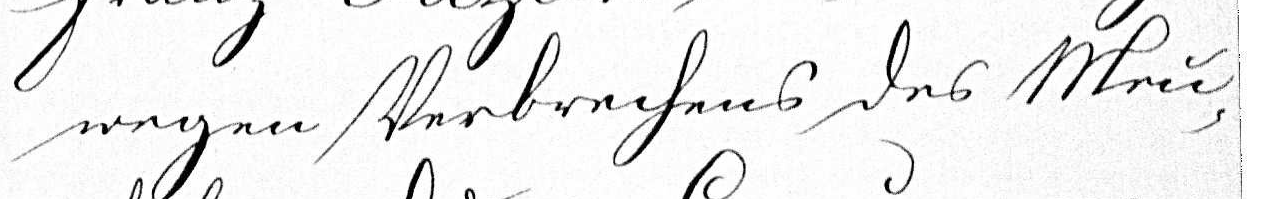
wegen Verbrechens des Meu¬
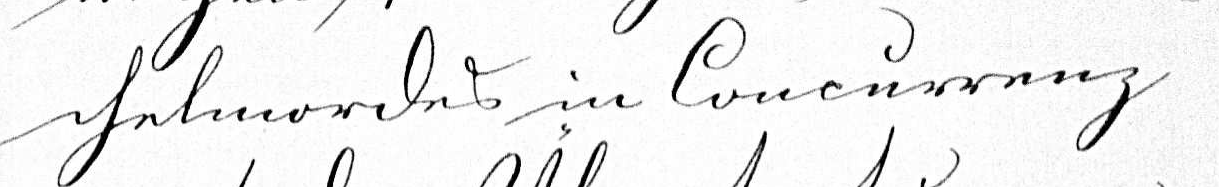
chelmordes in Concurrenz
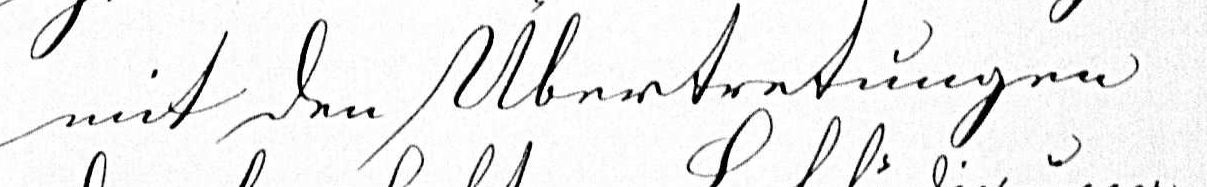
mit den Übertretungen
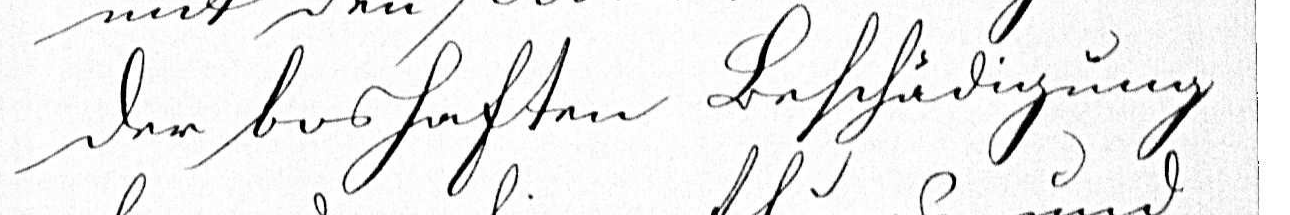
der boshaften Beschädigung
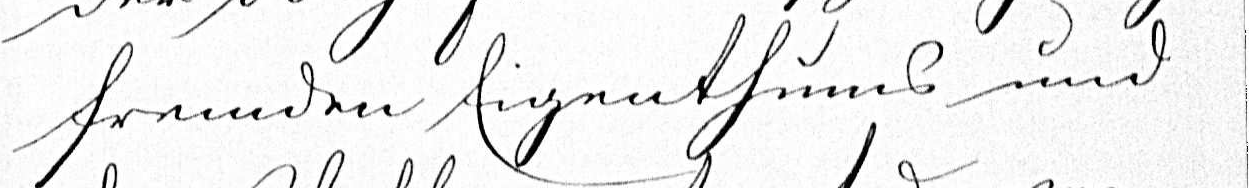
fremden Eigenthums und
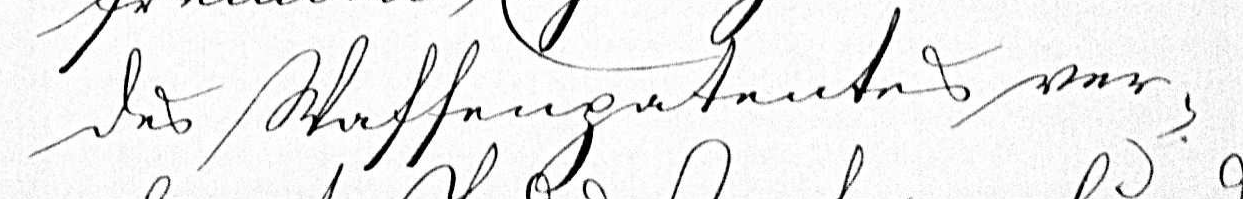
des Waffenpatentes ver¬
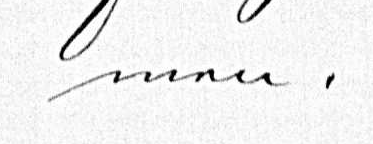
men.
